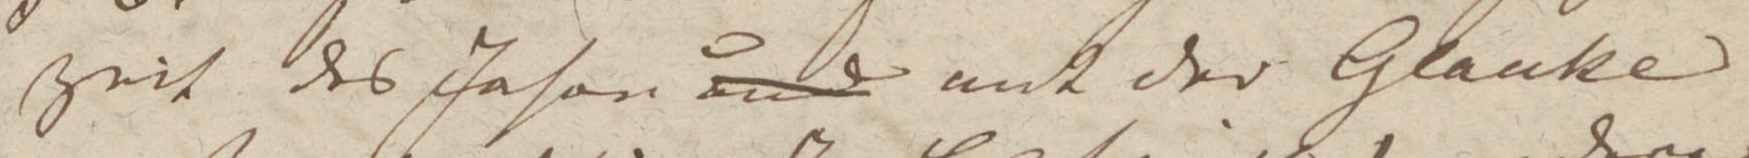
zeit des Jason und mit der Glauke
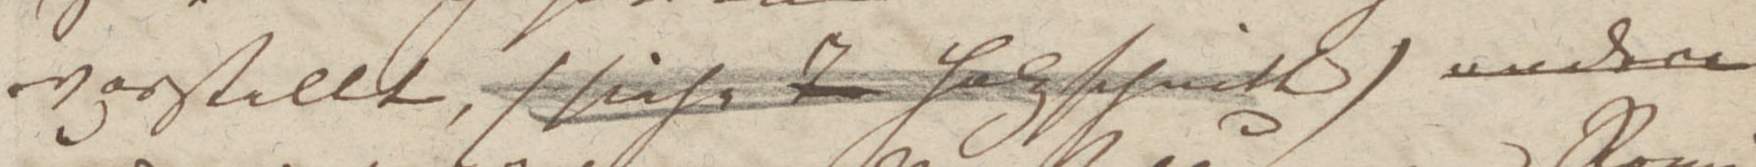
vorstellt, (siehe T Holzschnitt) andere
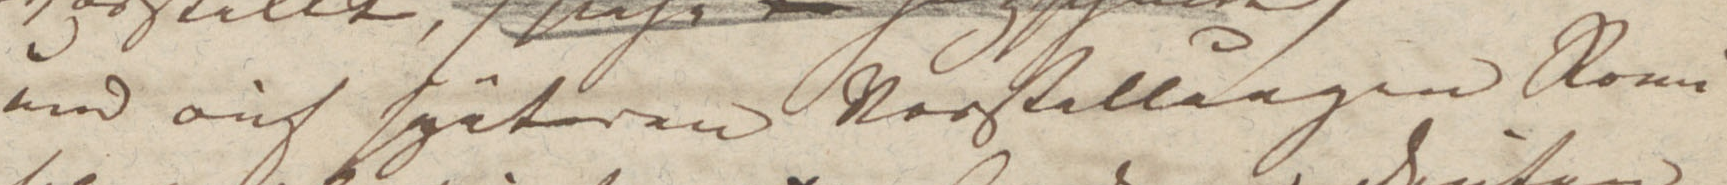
und auf späteren Vorstellungen Romi
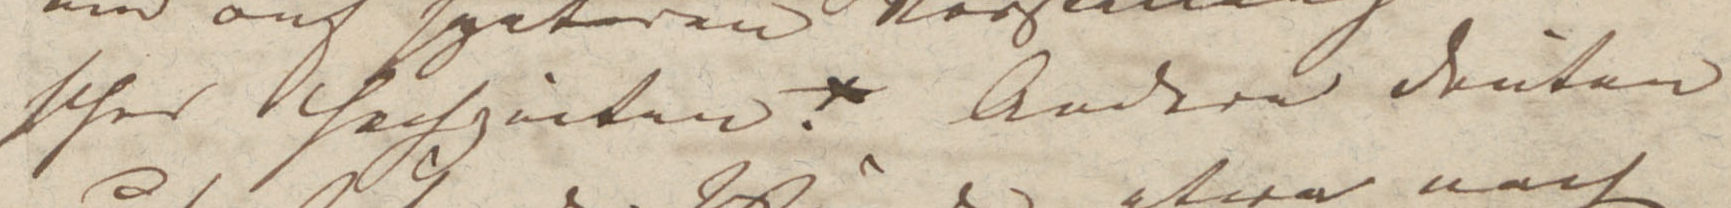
scher Hochzeiten.% Andere deuten
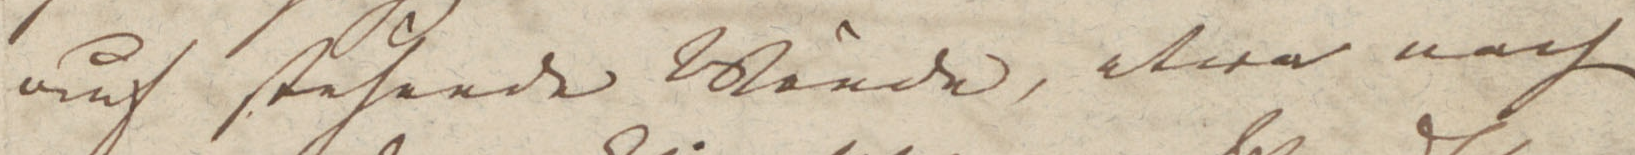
auf stehende Wände, etwa nach
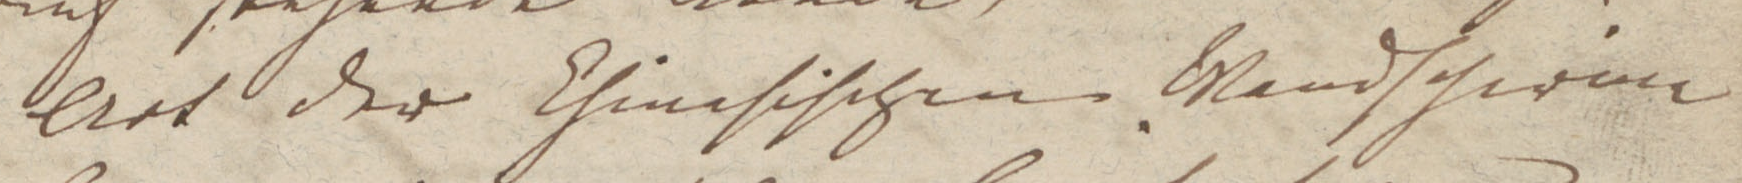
Art der Chinesischen Wandschirme
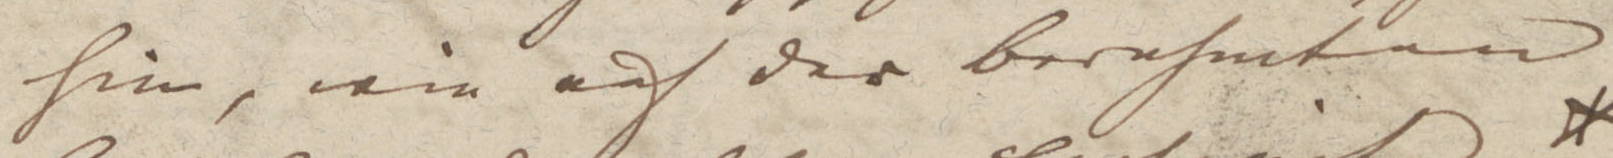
hin, wie auf der berühmten
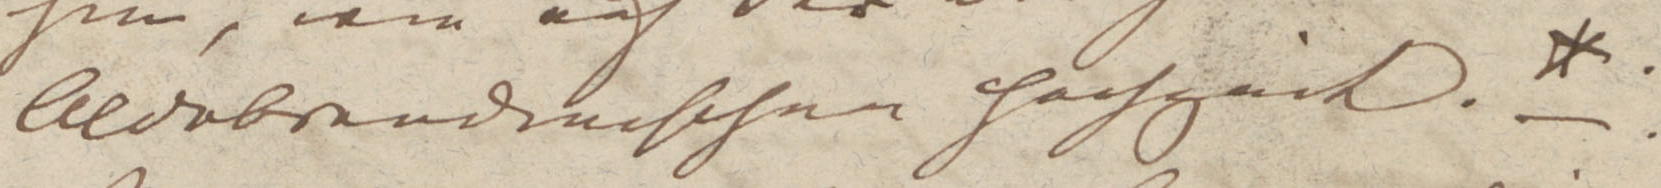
Aldobrandinischen Hochzeit. – . %
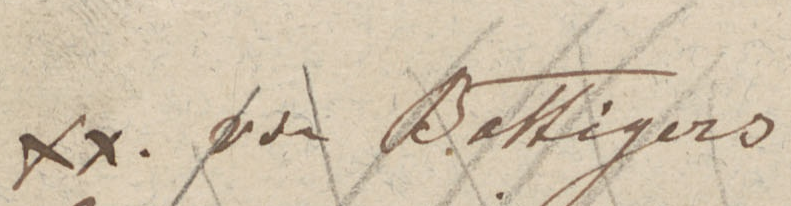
% vde Bottigers
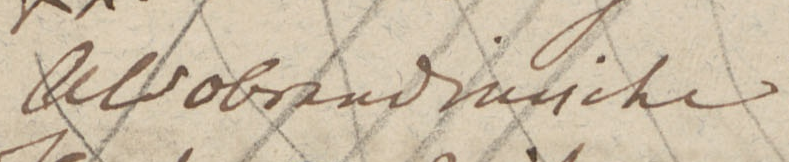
Aldobrandinische
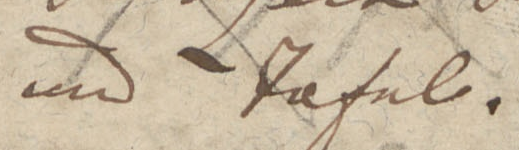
und Tafel
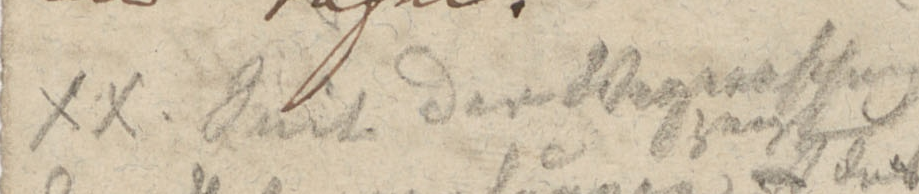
% Seit der Wegwischung
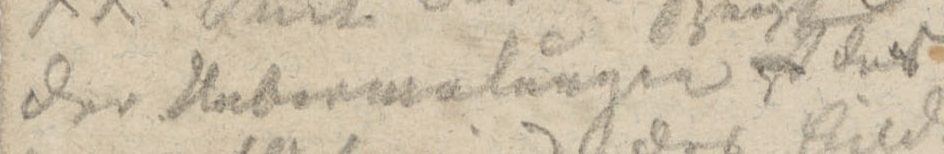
der Uebermalungen ist zeigt
